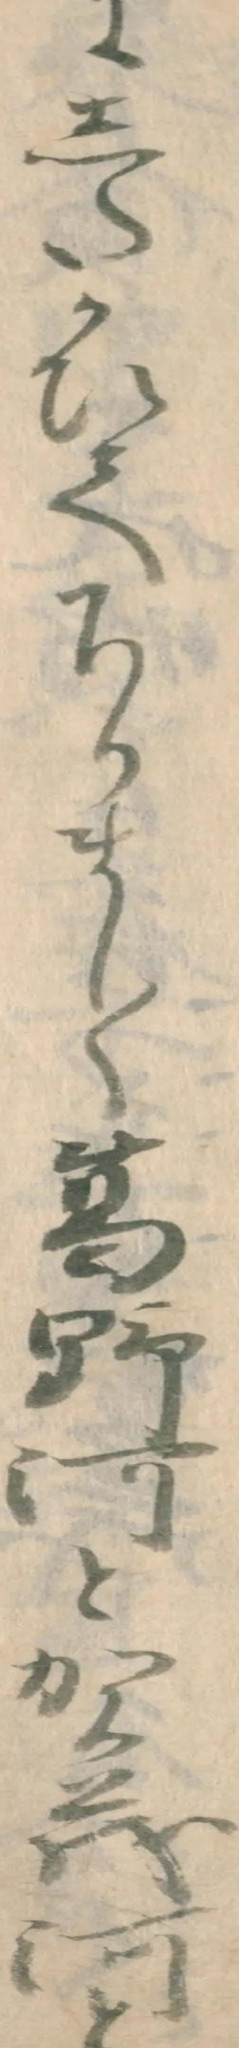にしたかひて下りまし〳〵葛野河と賀茂河と
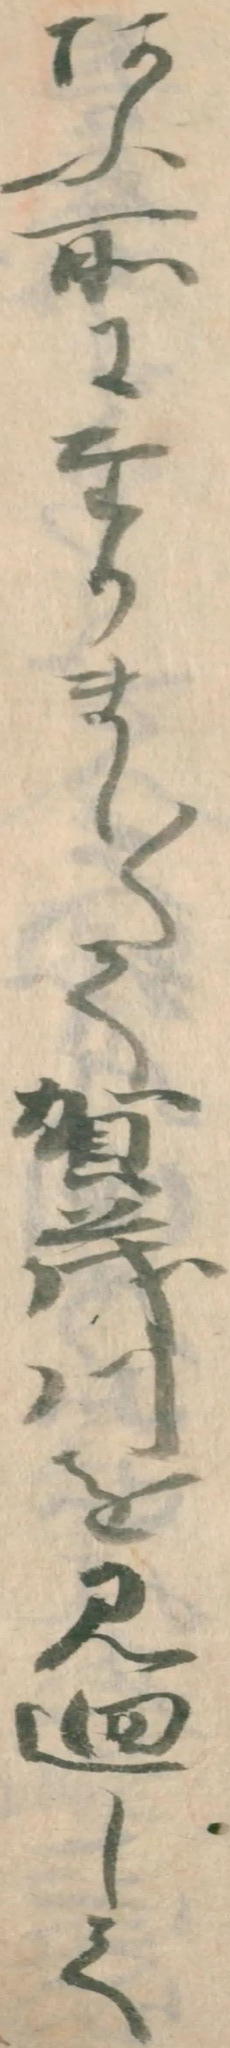あふ所に奉りまし〳〵て賀茂川を見廻して
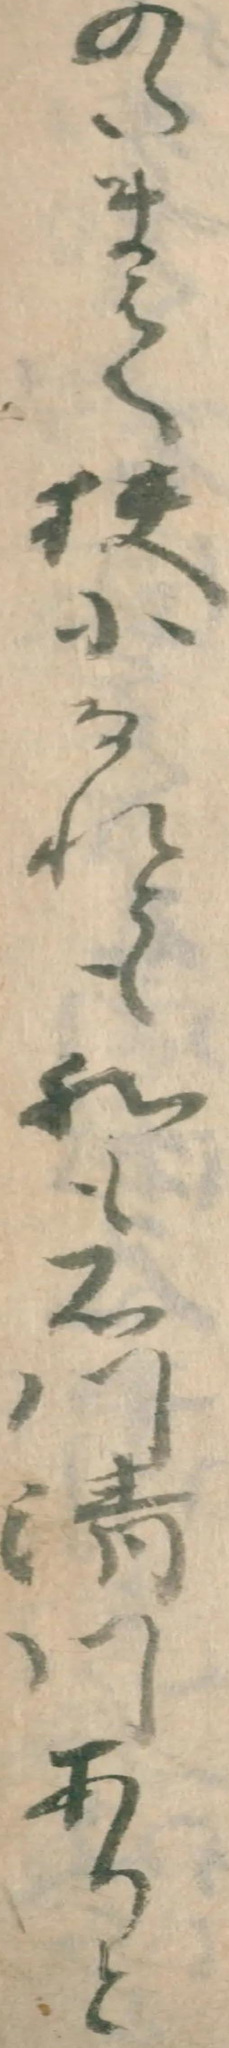のたまはく狭小なれとも然も石川清川ありと

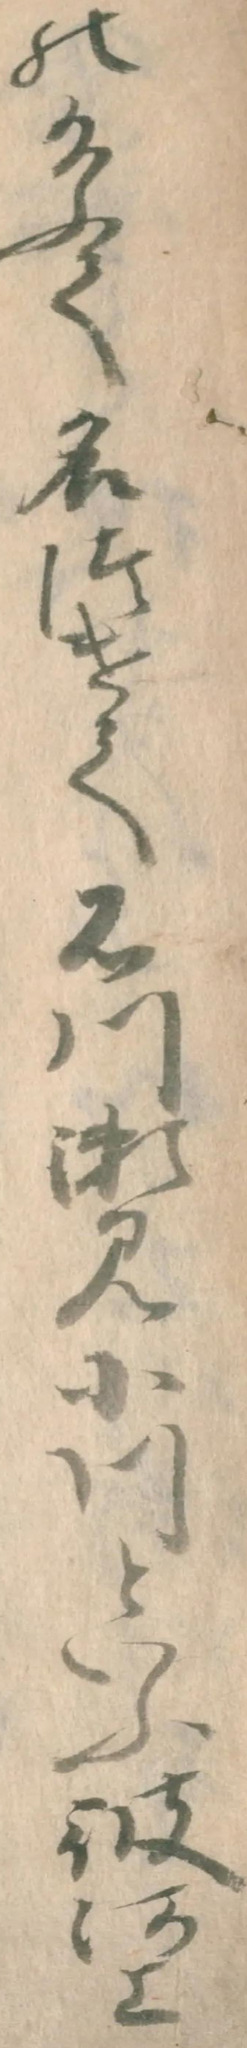の給ふて名つけて石川瀬見小川といふ彼河上
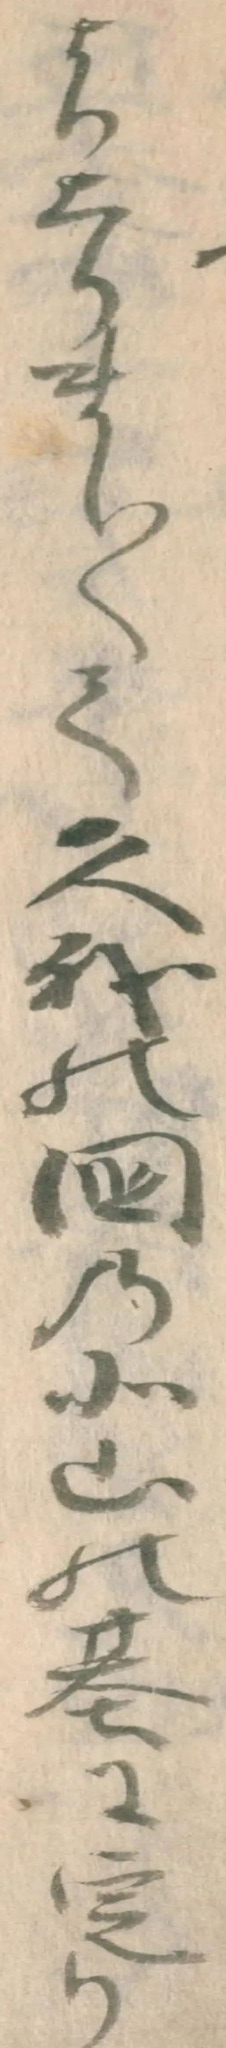より上りまし〳〵て久我の国の北山の基に定り
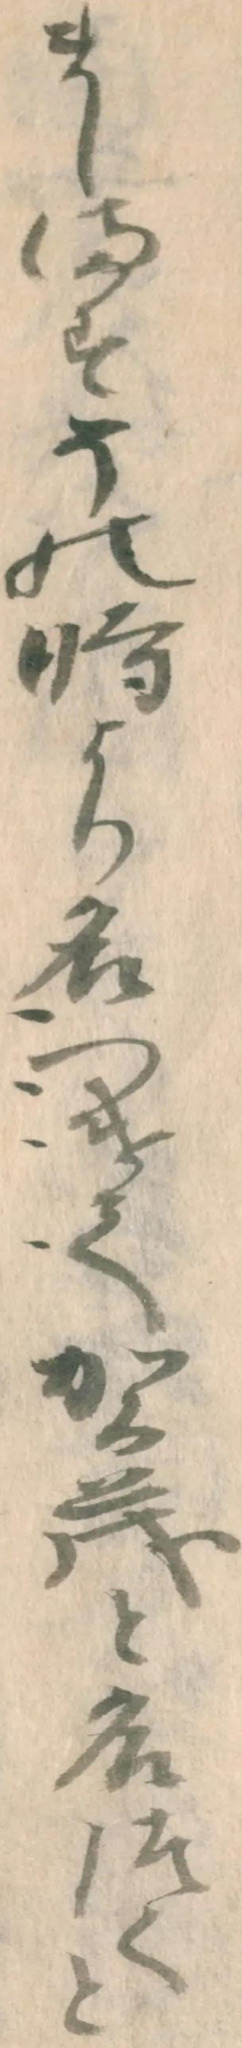ましますその時より名つけて賀茂と名つくと
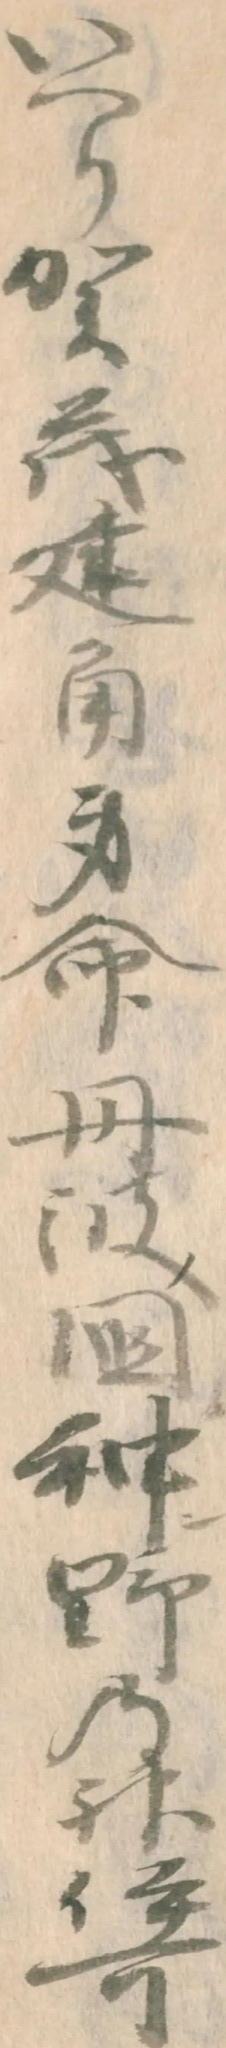いへり賀茂建角身命丹波国神野の神伊可
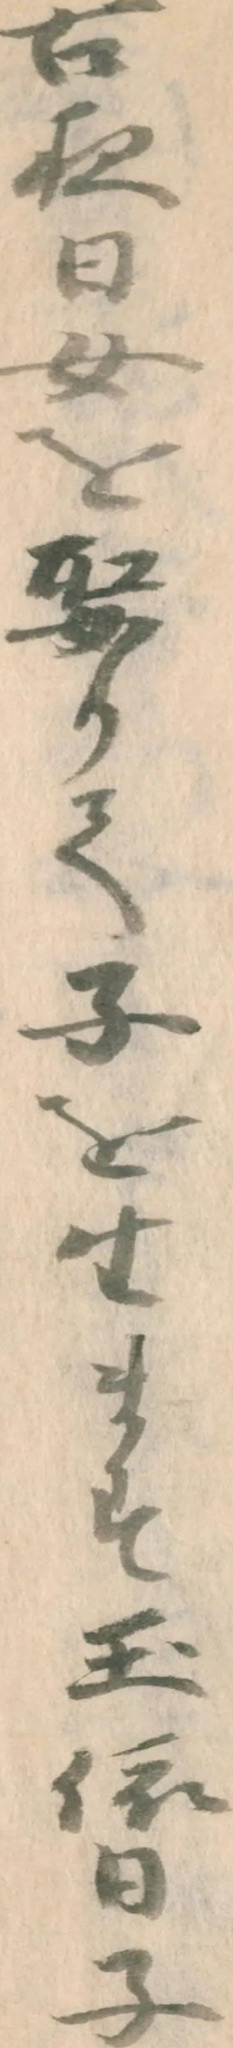古夜日女を娶りて子を生ます玉依日子
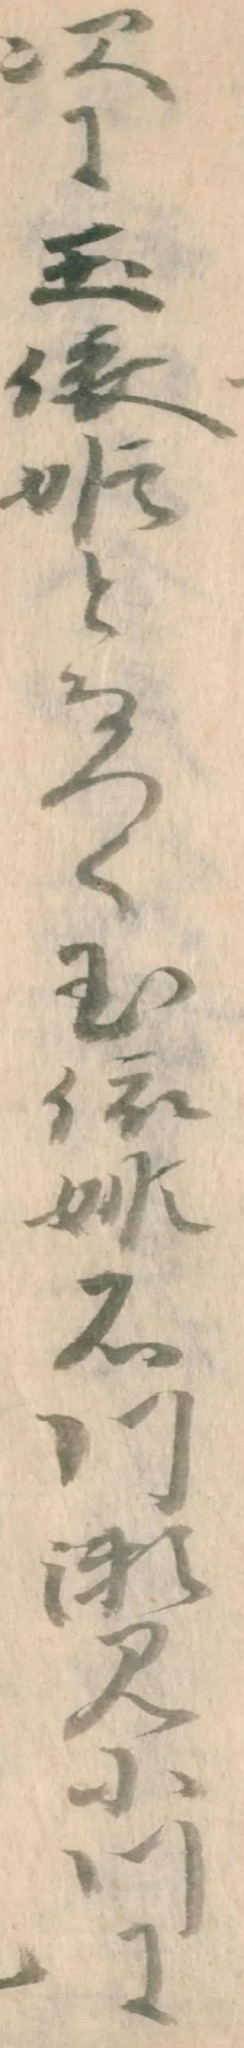次に玉依姫となつく玉依姫石川瀬見小川に
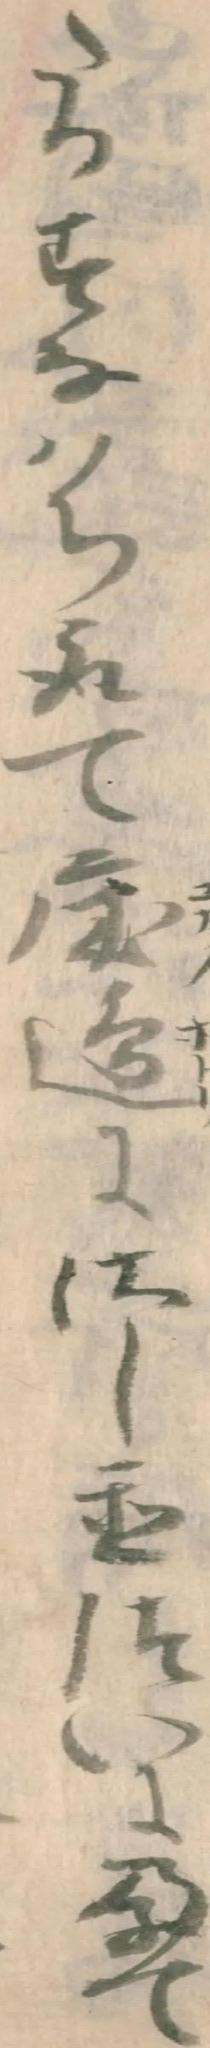たるすなはち取て床辺にさし置ついに孕て
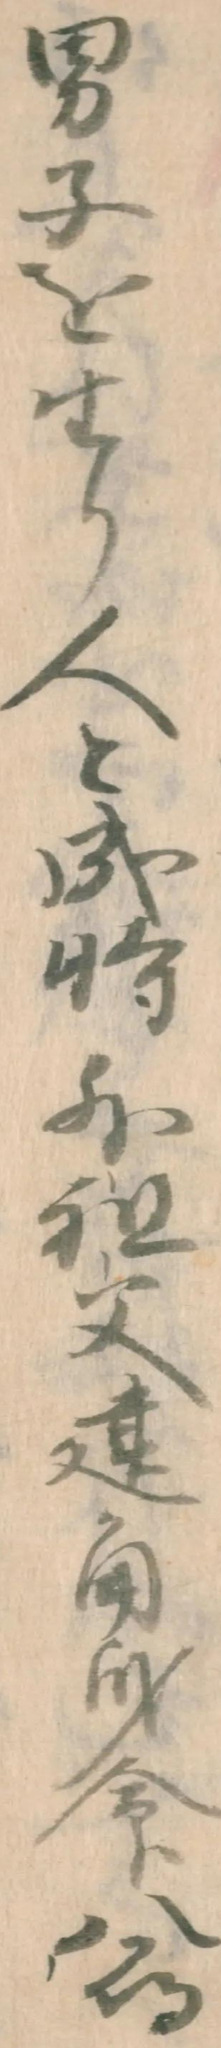男子を生り人と成時外-祖-父建角身命八-尋
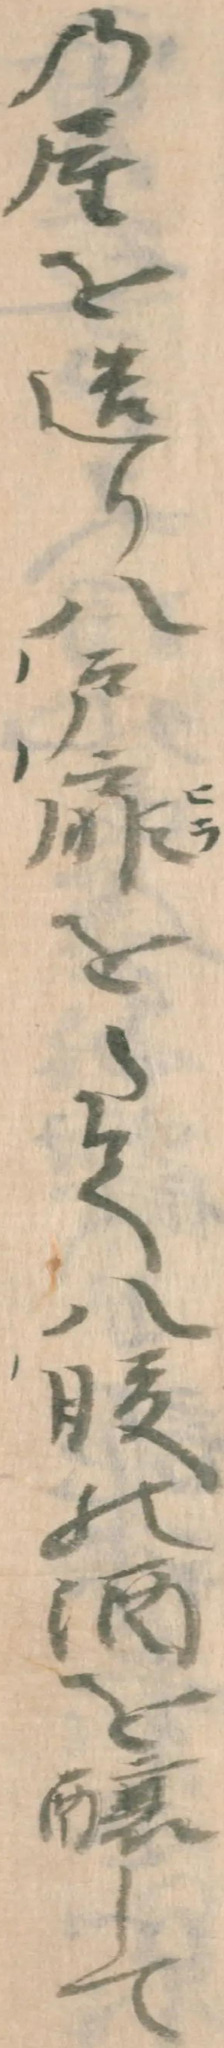の屋を造り八-戸-扉をたて八-腹の酒を醸して
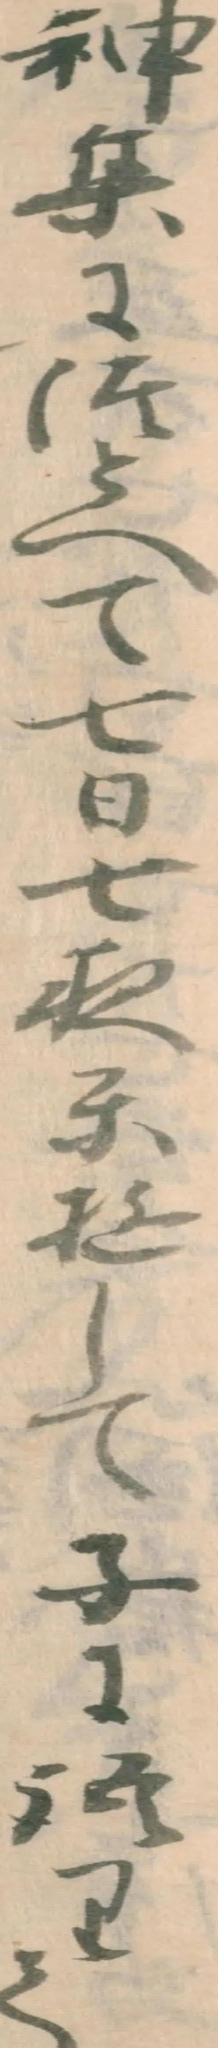神集につとへて七日七夜楽遊して子に語りて
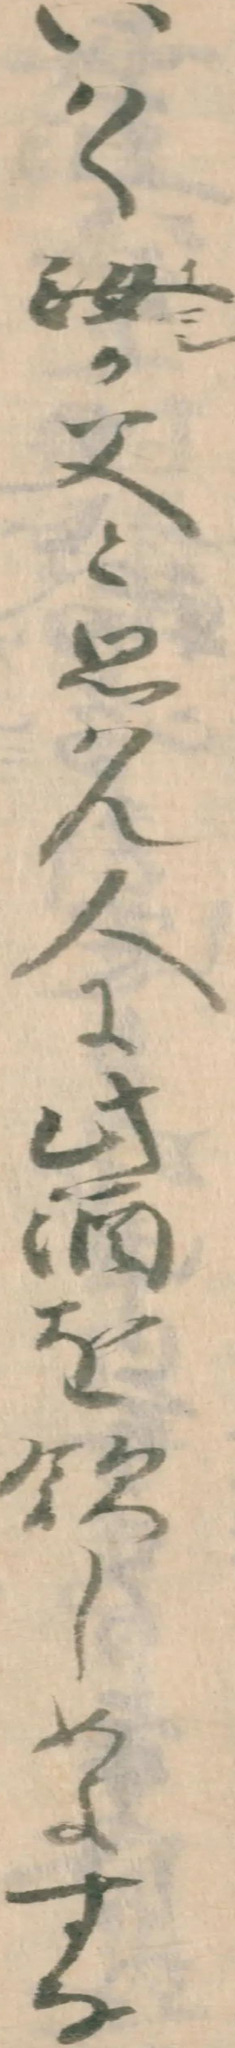いはく汝か父と思はん人に此酒を飲しめよすな
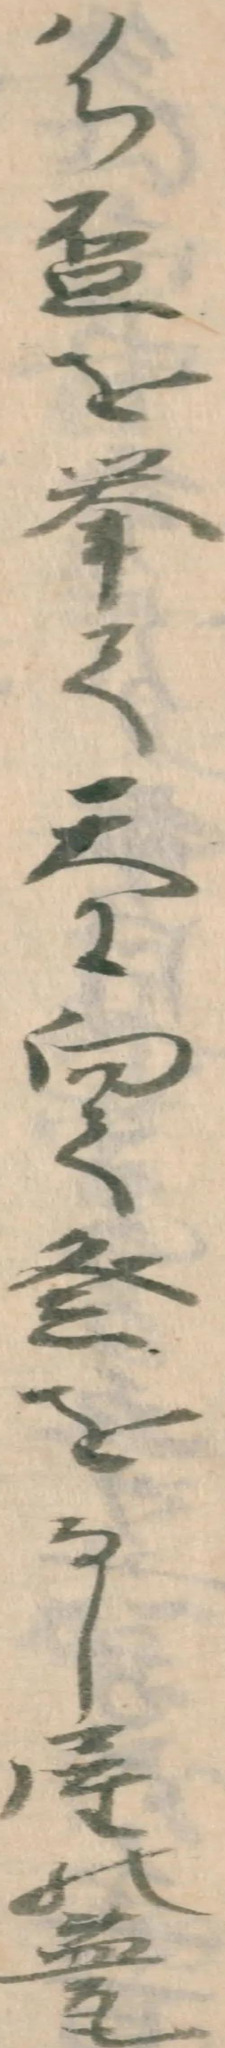はち盃を挙て天に向て祭をなし屋の甍
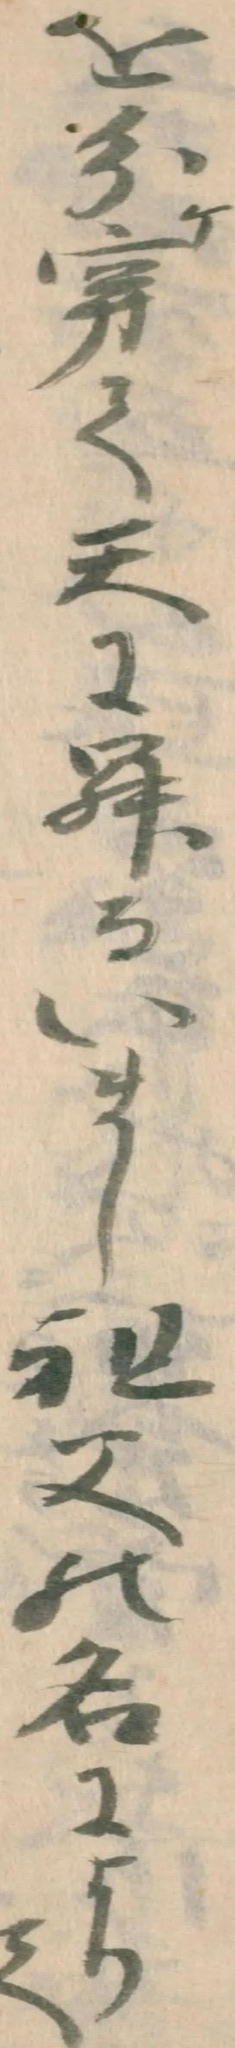を分穿て天に昇るいまし祖父の名によりて
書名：賀茂社記録. 第1冊
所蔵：国立国会図書館 National Diet Library, JAPAN
